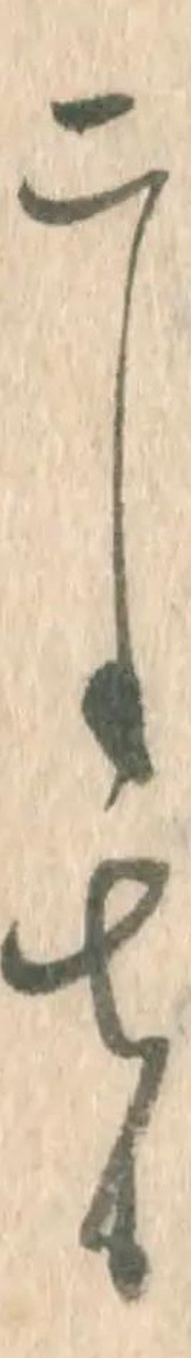二月七日

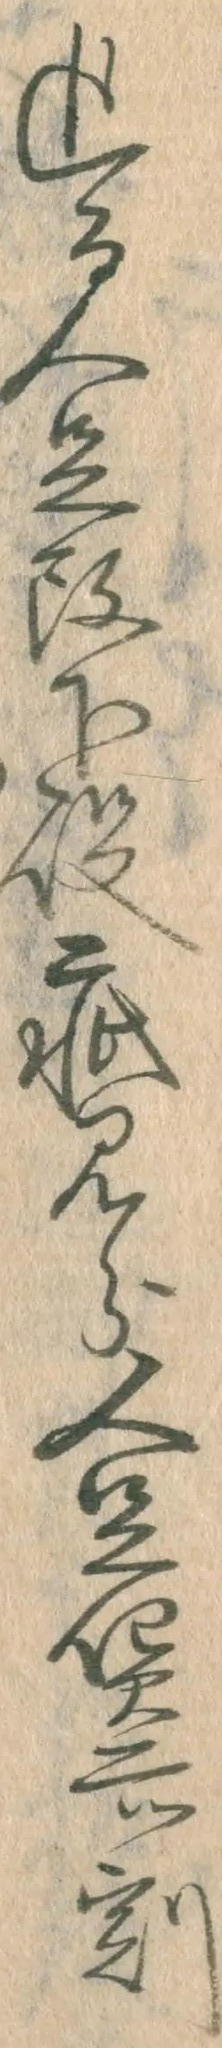追て人足改下役疵見分人足賃二ツ割
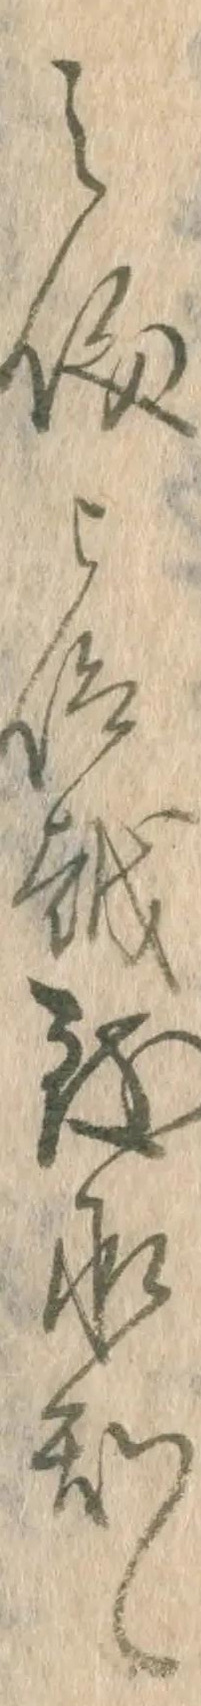之儀被仰越致承知候
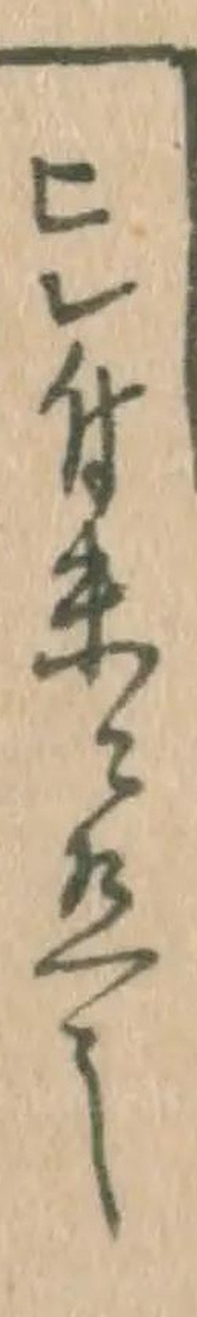│ヒレ付末ニ有之
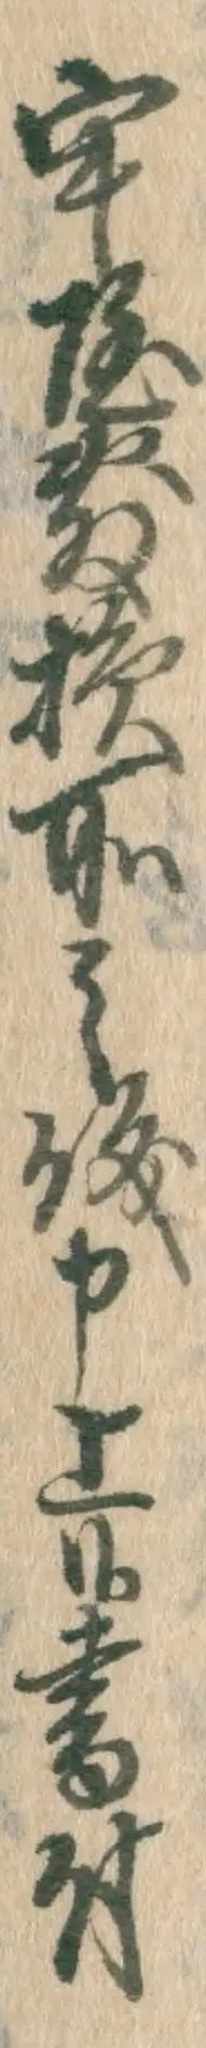│牢屋敷損所之儀申上候書付
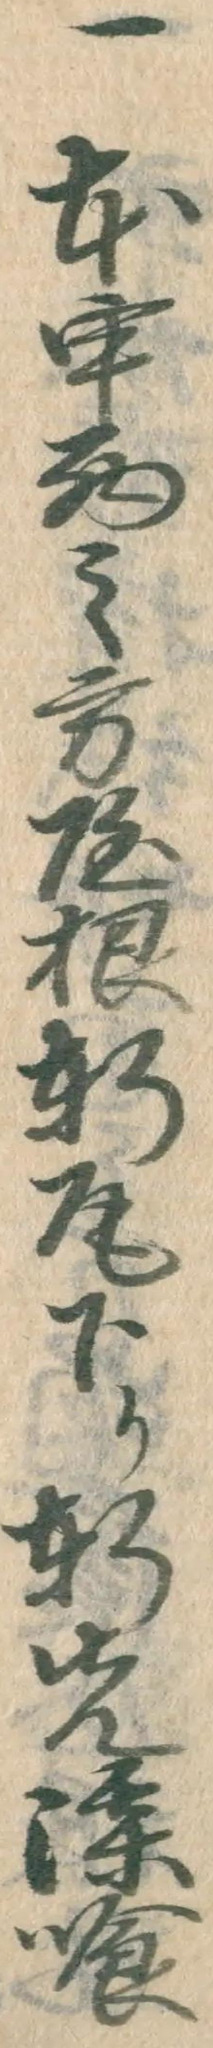一本牢西之方屋根軒瓦下り軒先漆喰
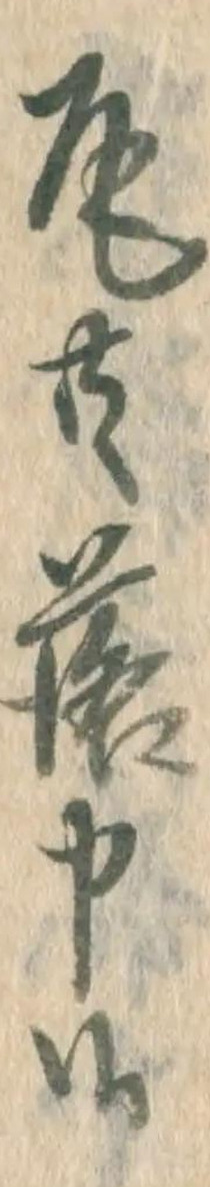瓦共落申候

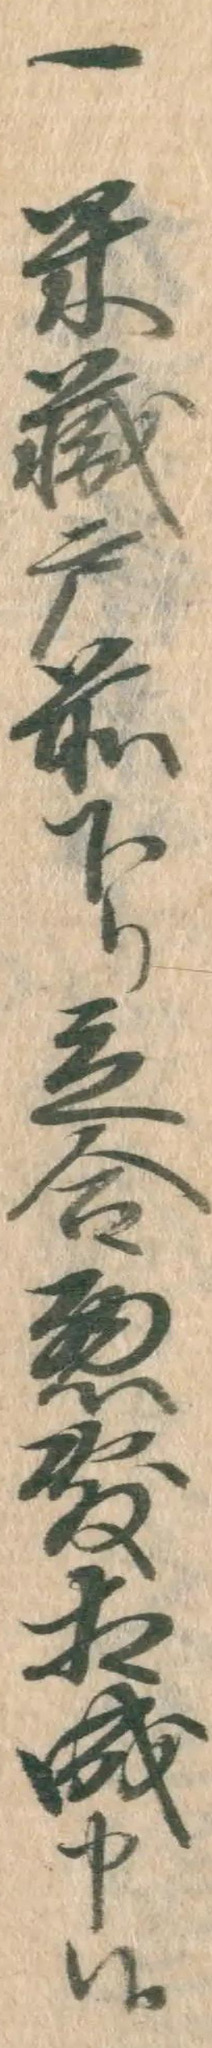一米蔵戸前下り立合悪敷相成申候
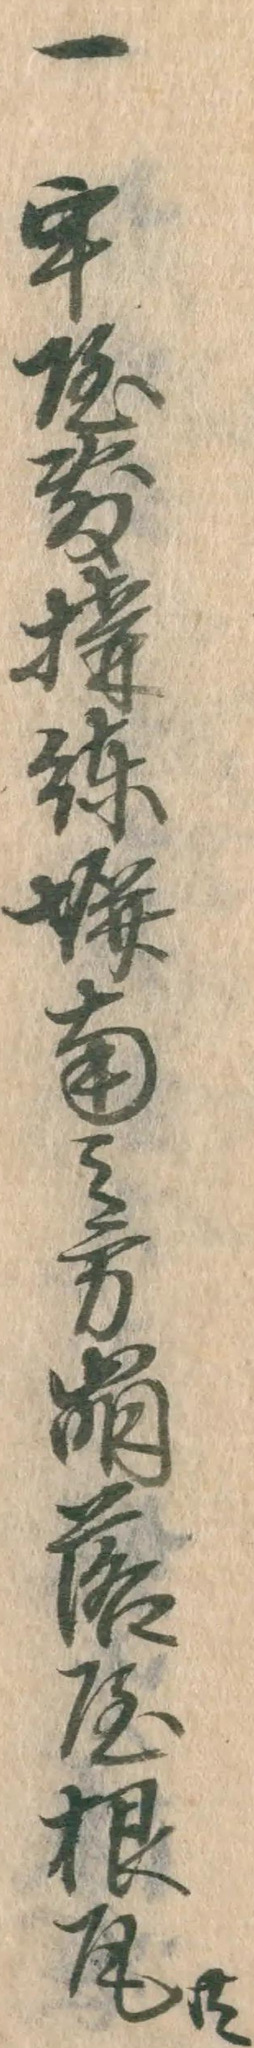一牢屋敷構煉塀南之方崩落屋根瓦共
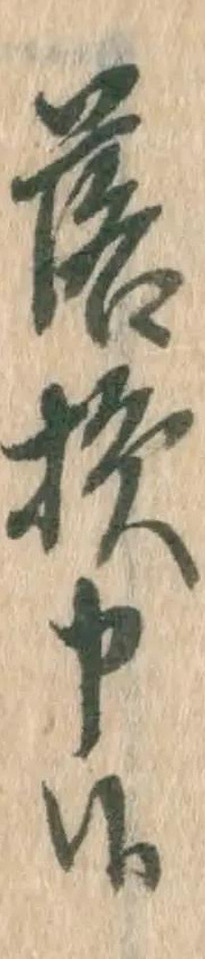落損申候
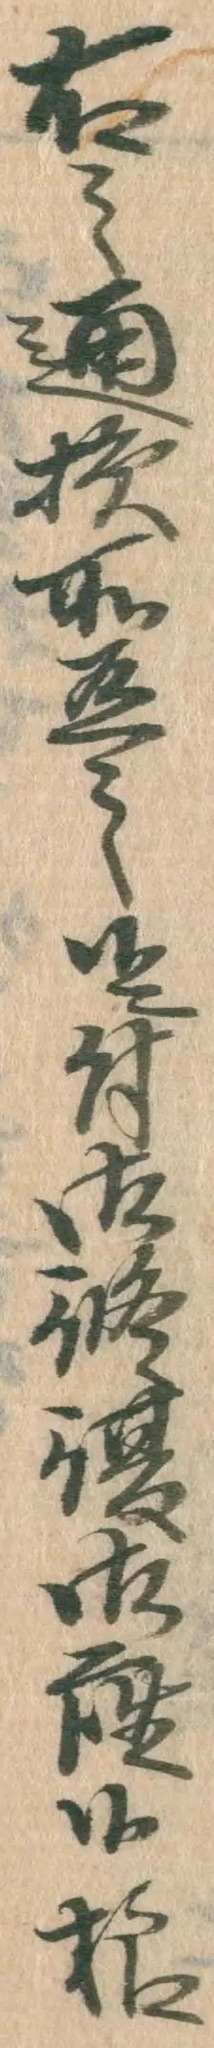右之通損所有之候ニ付御修復御座候様
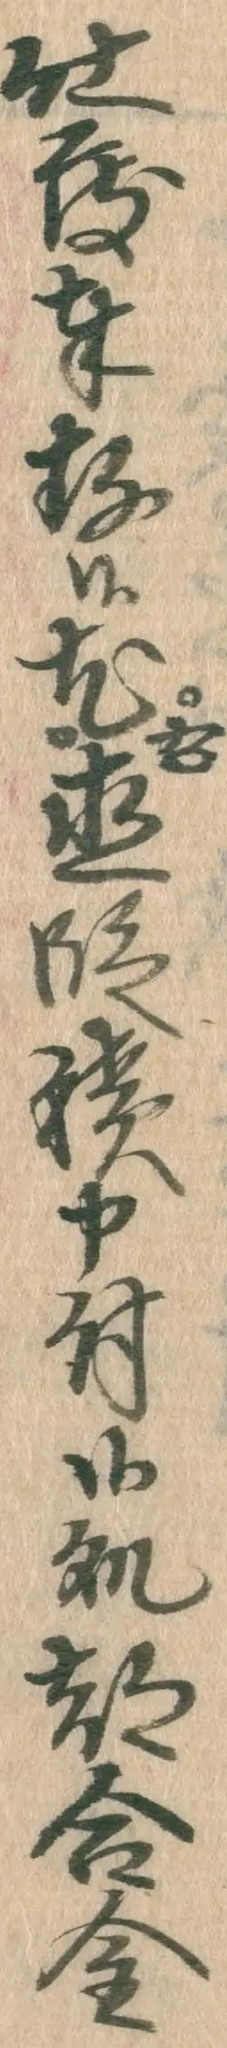仕度奉存候尤右直段積申付候処都合金
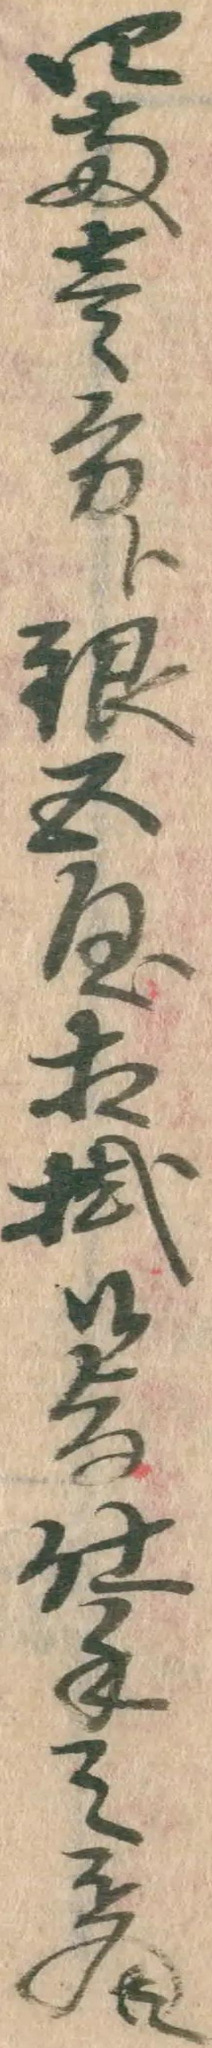四両壱分ト銀五匁相掛候棟仕手のもの共
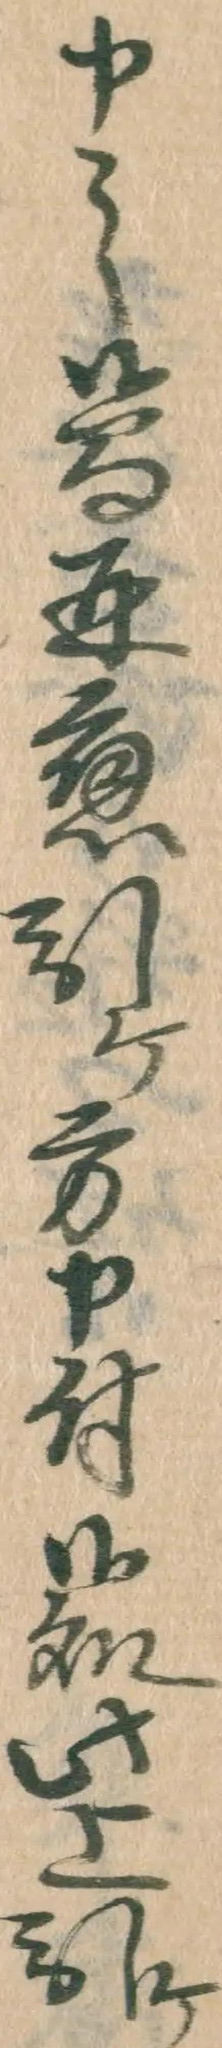申之候間再応引ケ方申付候処此上引ケ
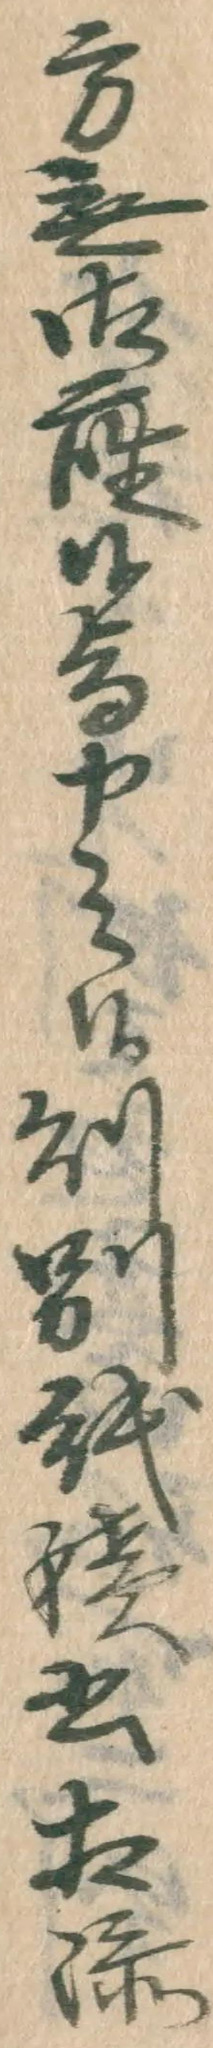方無御座候旨申之候即別紙積書相添
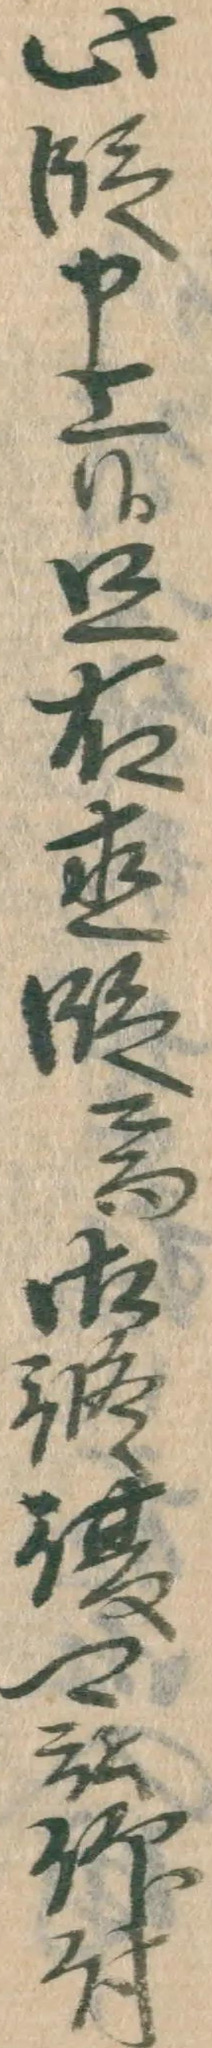此段申上候且右直段ニて御修復可被仰付
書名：七十冊物類集 71巻. [44] 四十三 牢屋敷御普請御修覆地震ニ付骨折候牢屋掛御褒美之部
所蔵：国立国会図書館 National Diet Library, JAPAN
